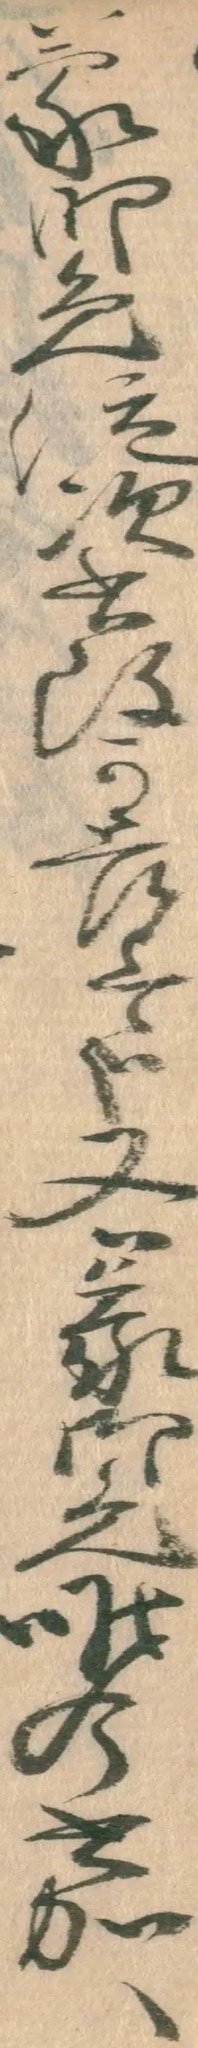蒙御免位次書改可差上候哉又ハ蒙御免唯今書加へ
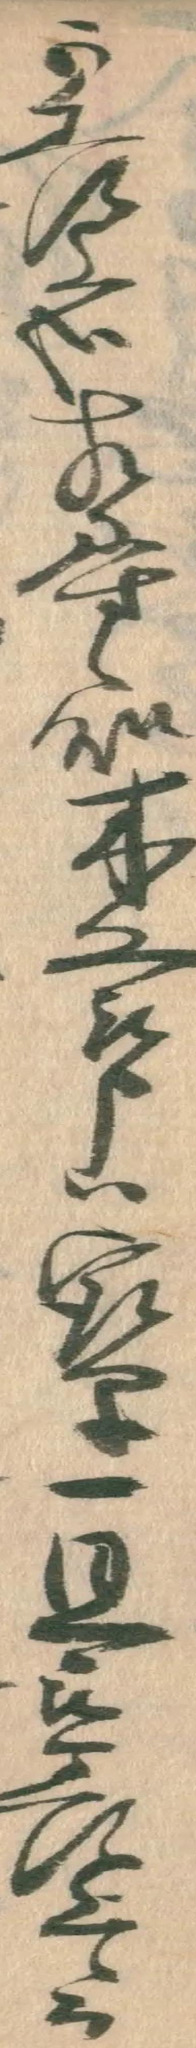可差上哉相尋候処木工被申ハ最早一旦被差上候而
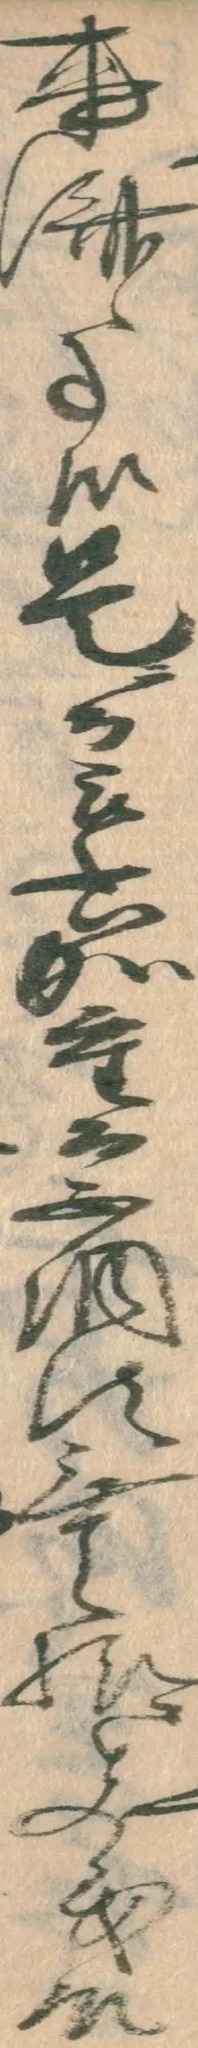事済候事故是ニ而被書加重而不調法無之様ニとの義故
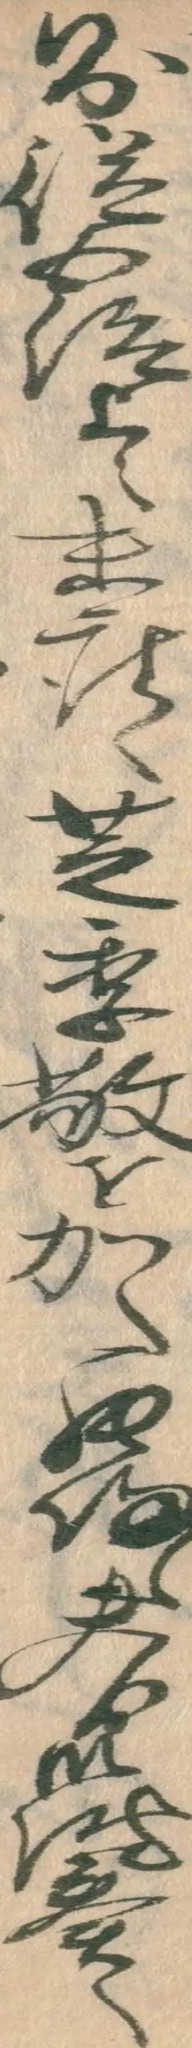則従五位上之未座へ芝季敬を加へ罷帰候夫ゟ御伝奏へ
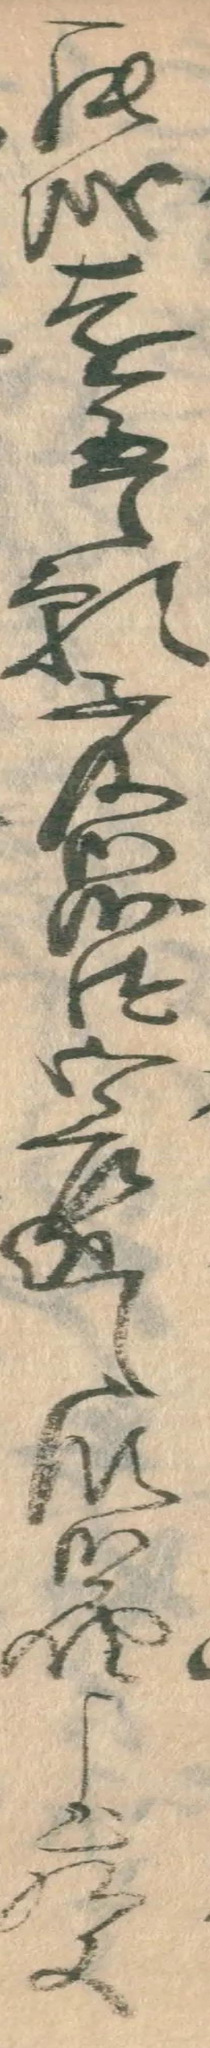罷越遠慮之願不及御沙汰御差返し候段御届申上将又
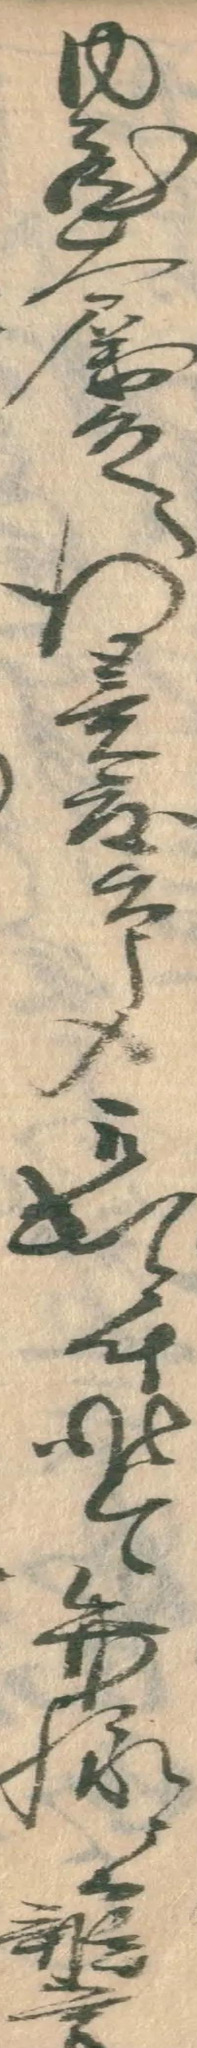内蔵大属殿へ得御意度旨申入被出候ニ付唯今弁様ニ而雑掌
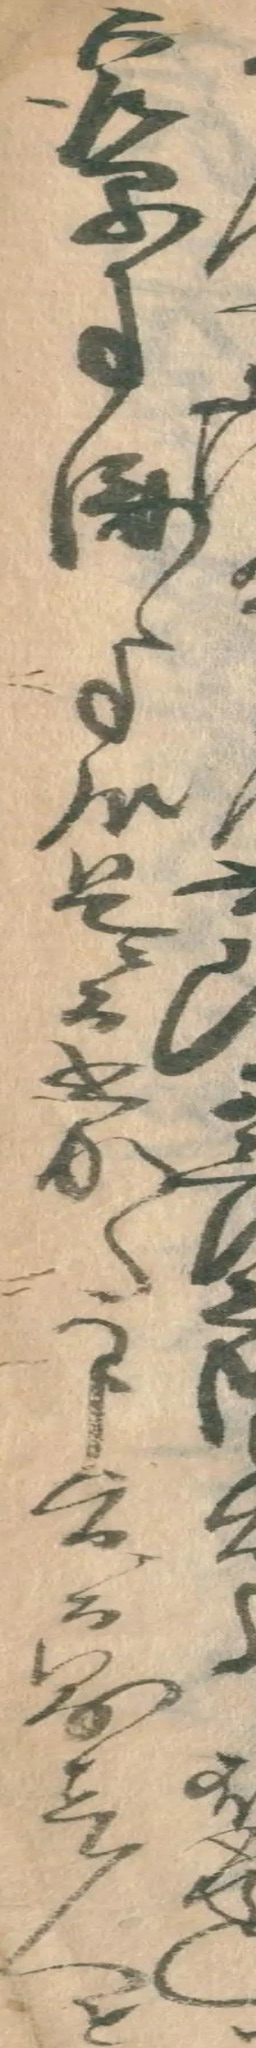最早事済候事故是ニ而書加へ可申旨ニ而則壱人を

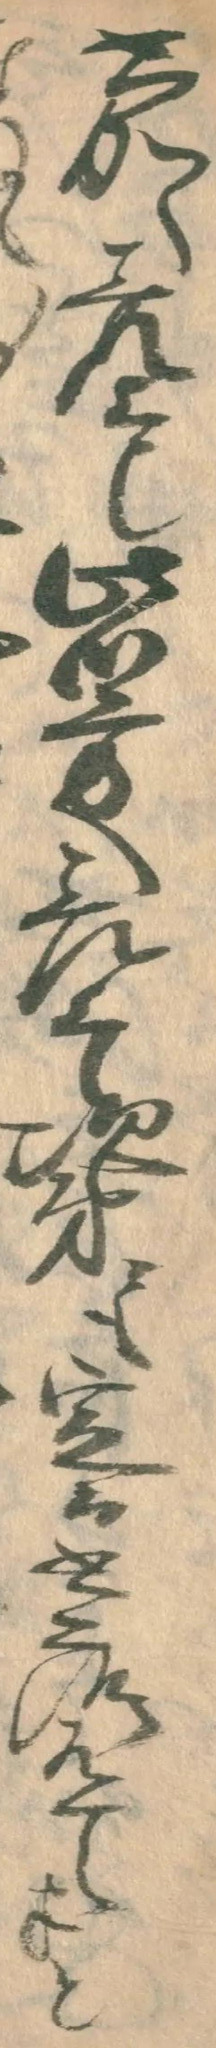書加へ差上申候此御方へ差上候次第ニも定而書落有之候半と
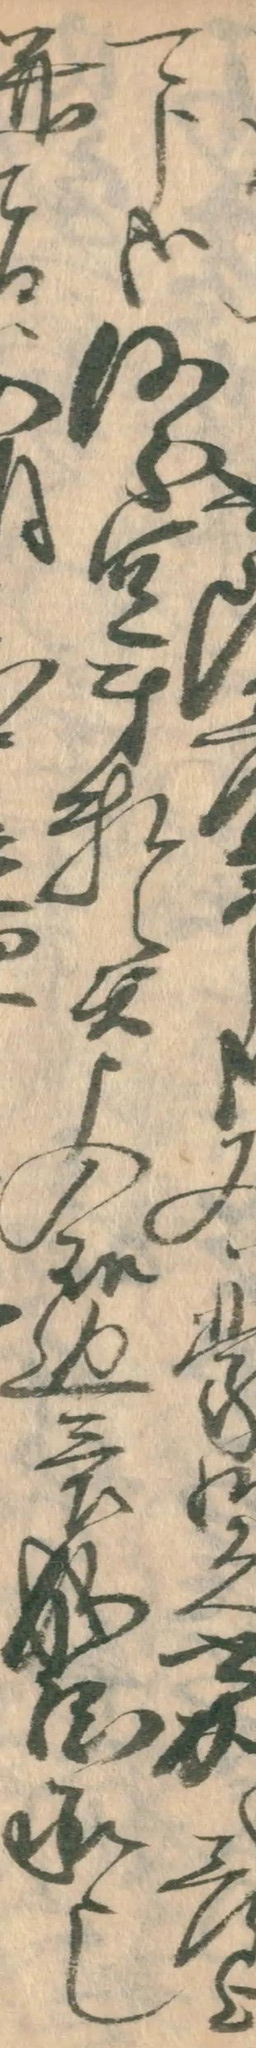可申哉何分宜奉頼候旨申入処返答成程承申候
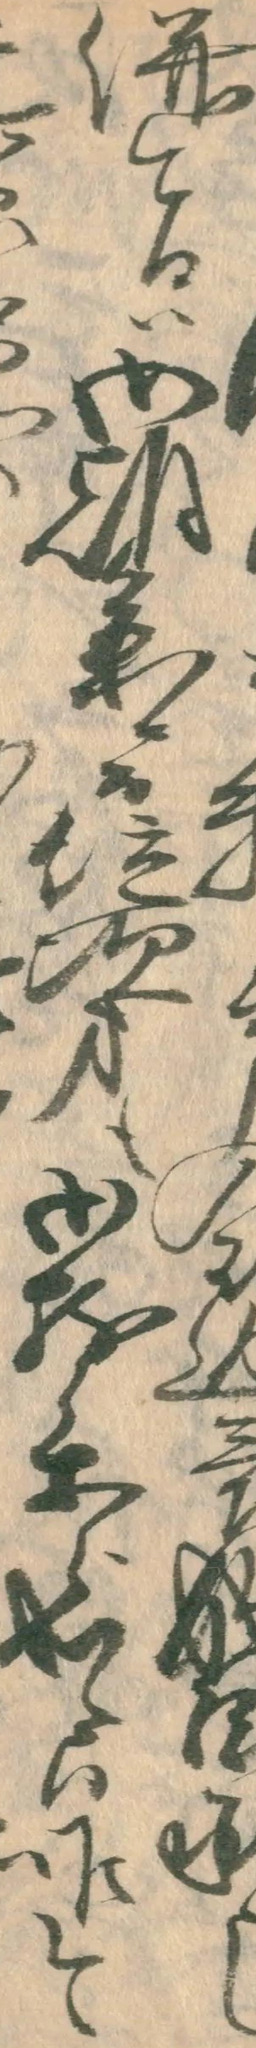併今日ハ御朝参ニ而位次第も御持参被成候間昨今
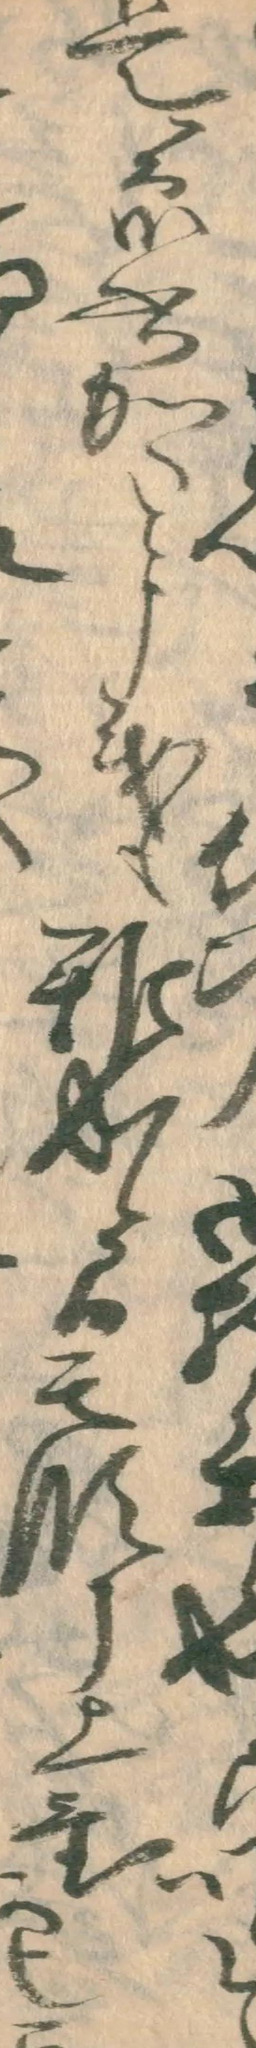是ニ而御書加へと申義も難成候間其段申上置可申候間
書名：賀茂社記録. 第60冊
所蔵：国立国会図書館 National Diet Library, JAPAN
